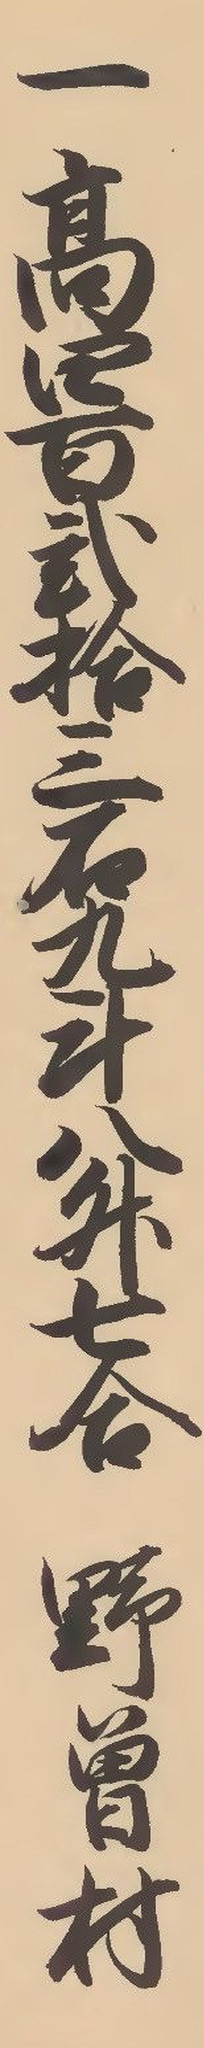一高四百弐拾三石九斗八升七合野曽村
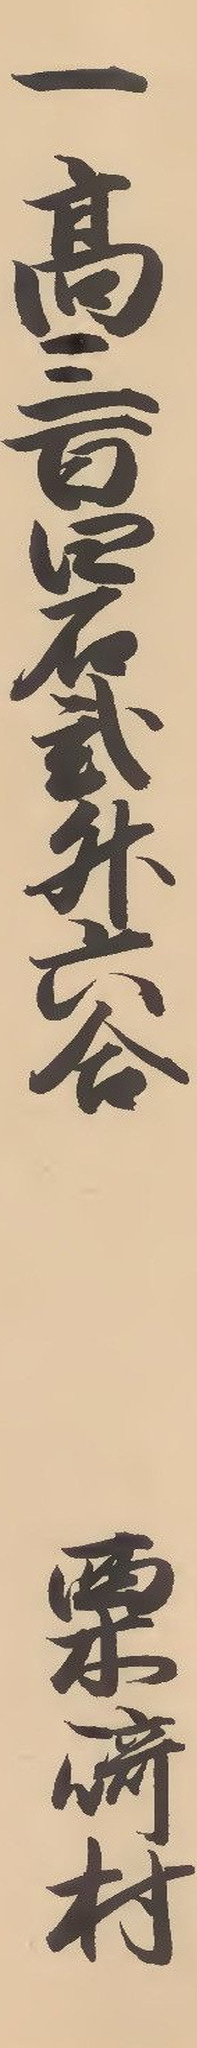一高三百四石弐升六合栗崎村
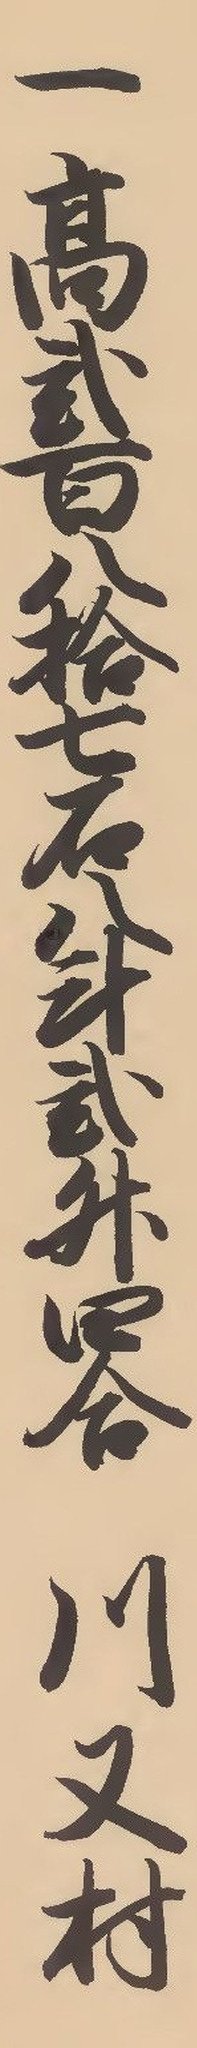一高弐百八拾七石八斗弐升四合川又村
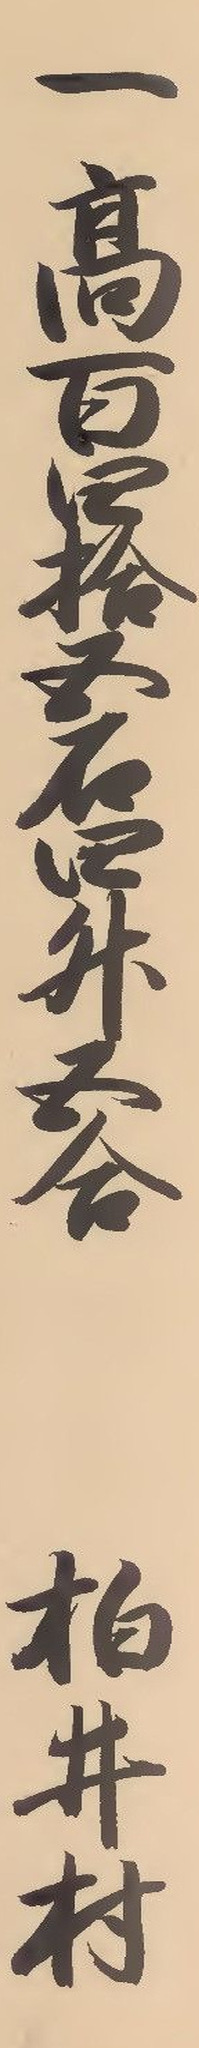一高百四拾五石四升五合柏井村
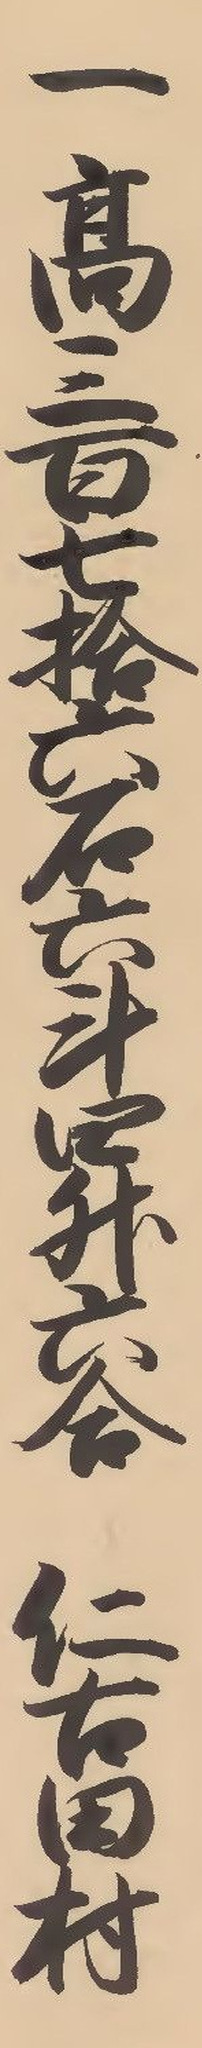一高三百七拾六石六斗四升六合仁古田村
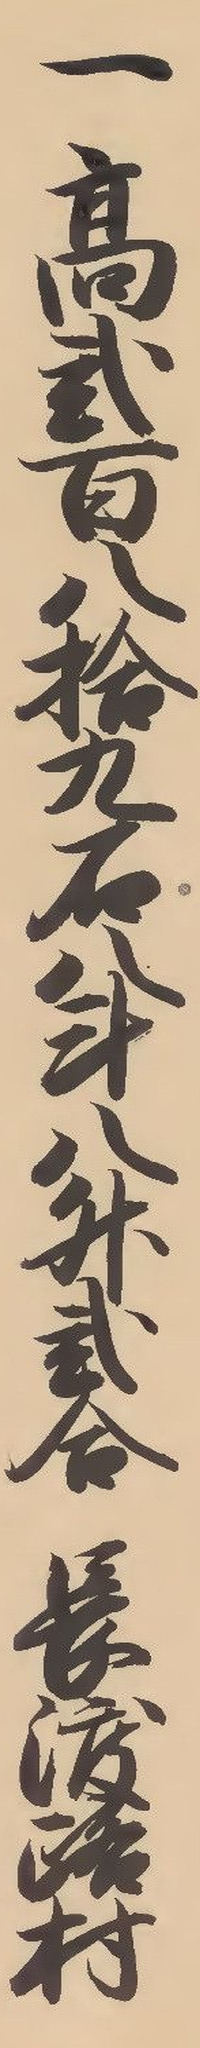一高弐百八拾九石八斗八升弐合長渡路村
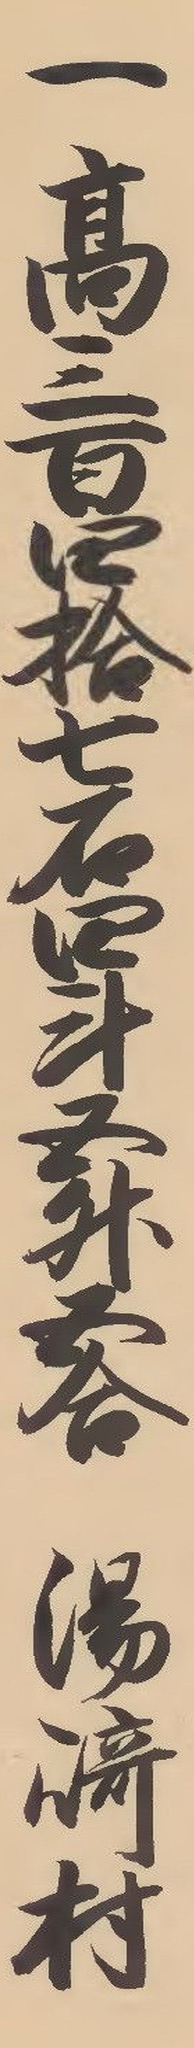一高三百四拾七石四斗五升五合湯崎村

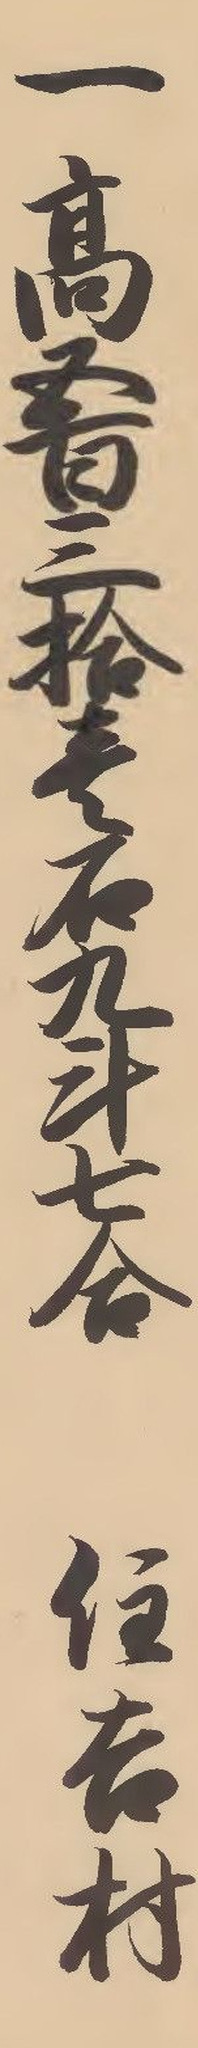一高五百三拾壱石九斗七合住吉村
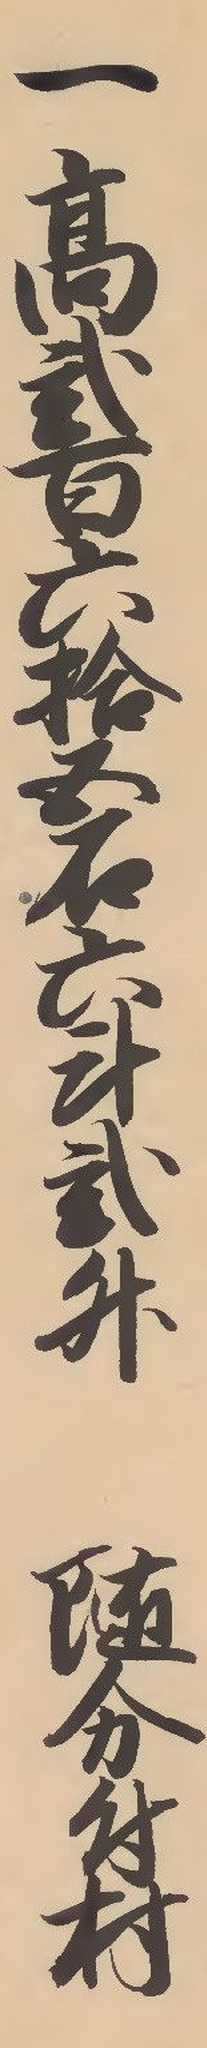一高弐百六拾五石六斗弐升随分付村
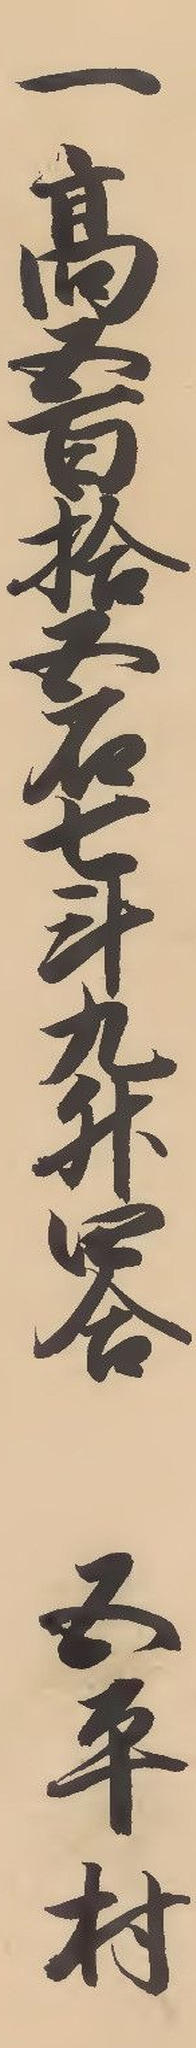一高五百拾五石七斗九升四合五平村
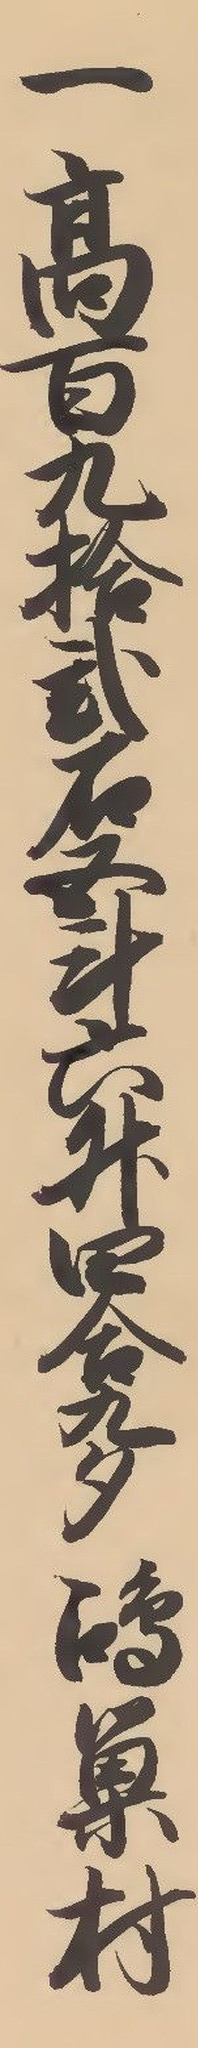一高百九拾弐石五斗六升四合九勺鴻巣村
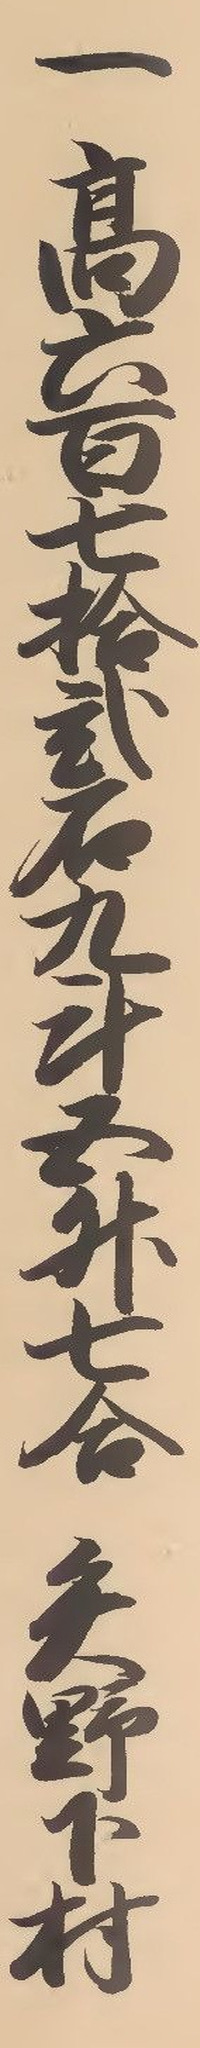一高六百七拾弐石九斗五升七合矢野下村
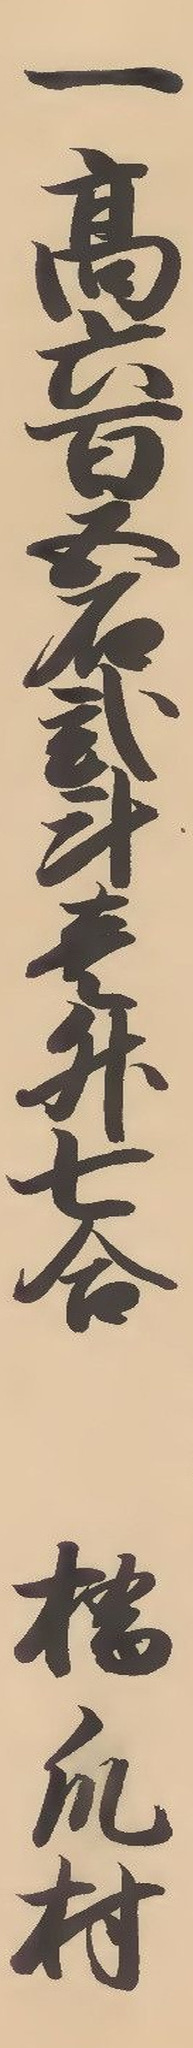一高六百五石弐斗壱升七合橋爪村
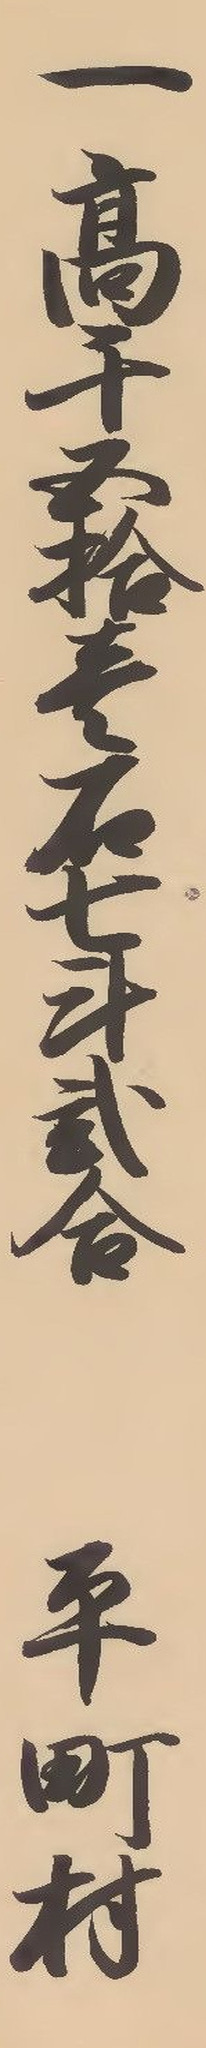一高千五拾壱石七斗弐合平町村
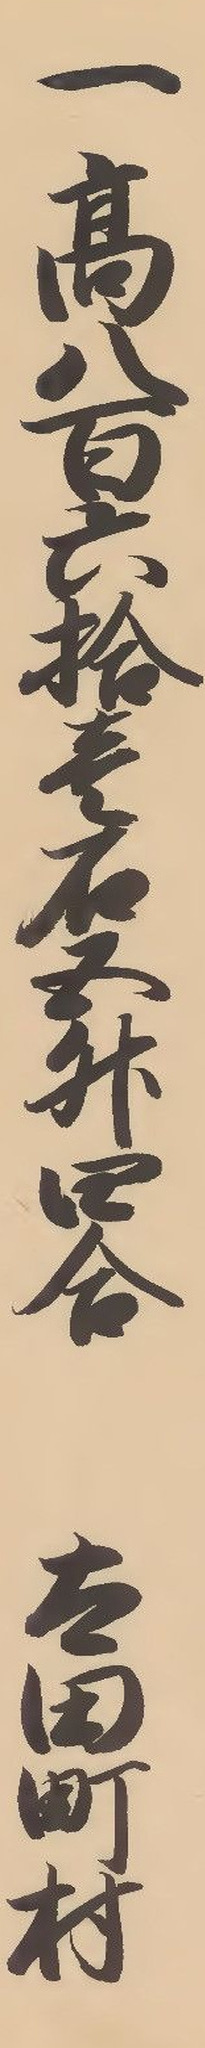一高八百六拾壱石五升四合太田町村

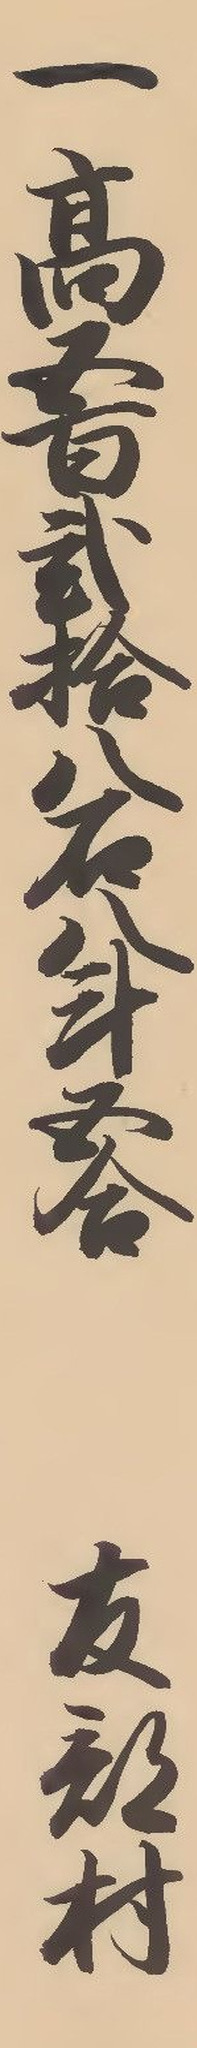一高五百弐拾八石八斗五合友部村
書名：常陸国郷帳
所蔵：国立公文書館 National Archives of Japan
